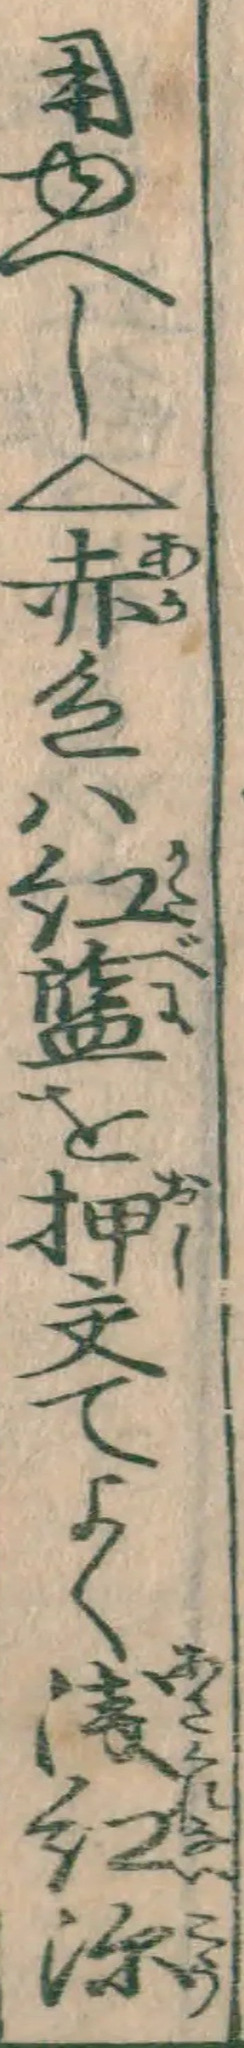用ゆへし△赤色は紅藍を押交てよし浅紅深
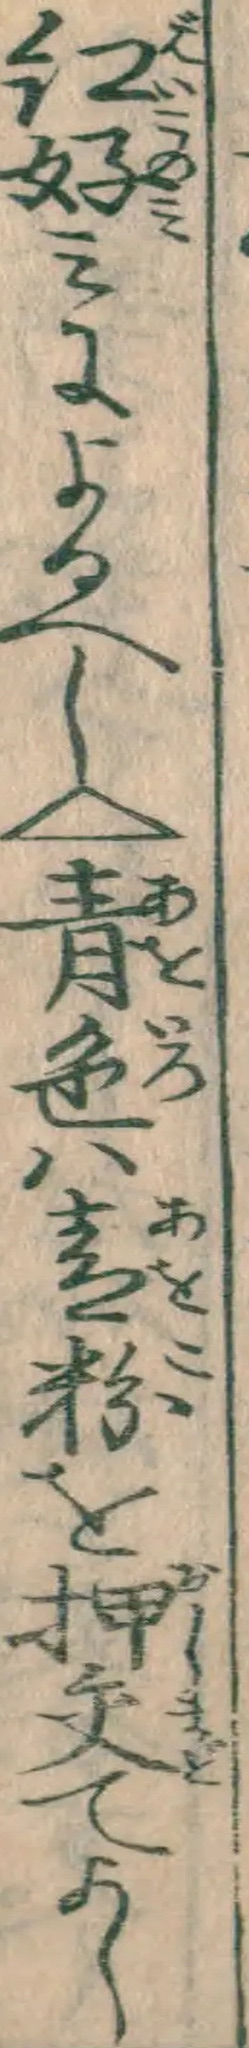紅好みによるへし△青色は青粉を押交てよし
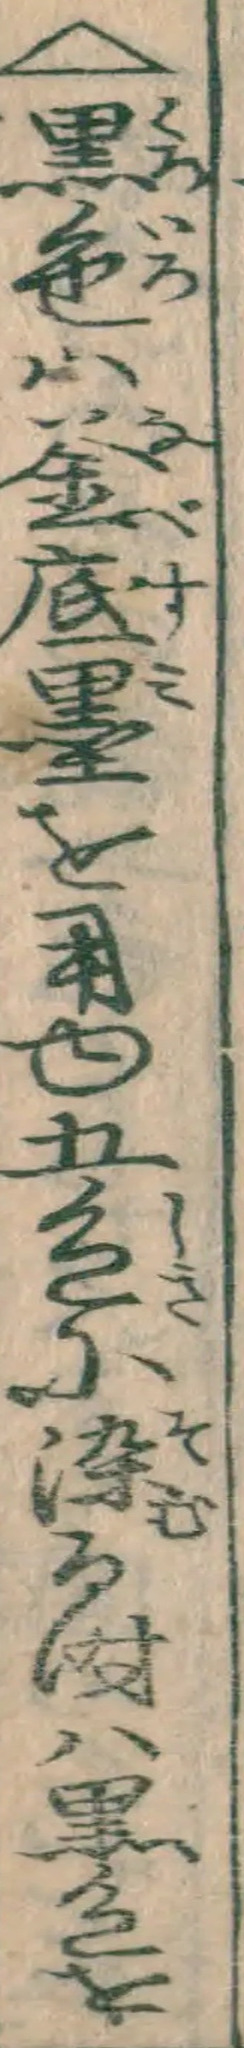△黒色は釜底墨を用ゆ五色に染る時は黒色を
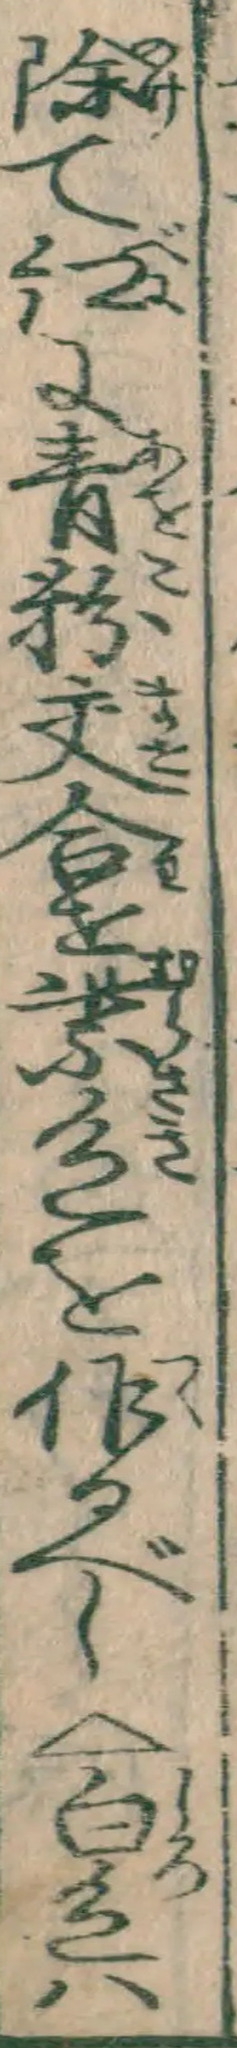除て紅に青粉交合せ紫色を作るべし△白色は
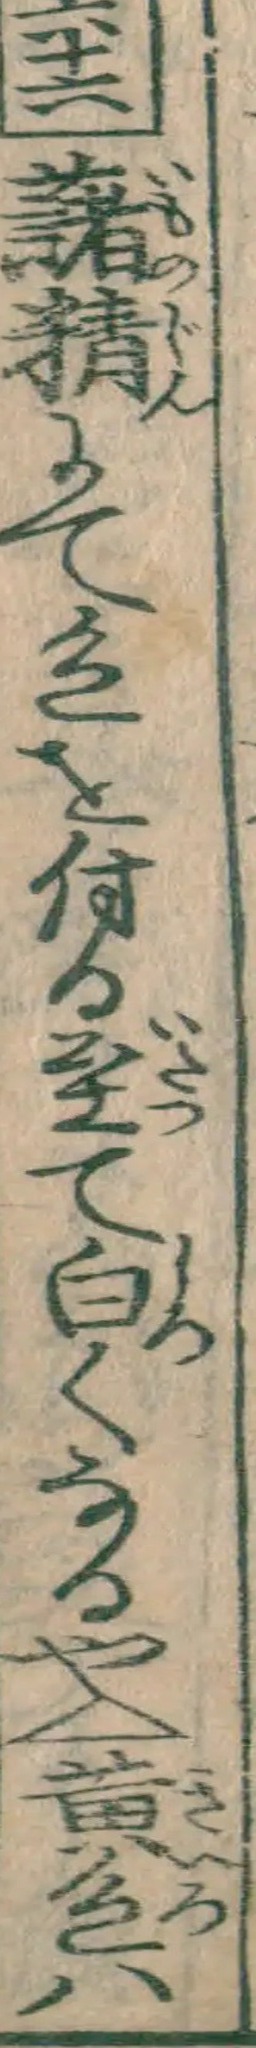[六十六]藷精にて色を付る至て白くなるや△黄色は

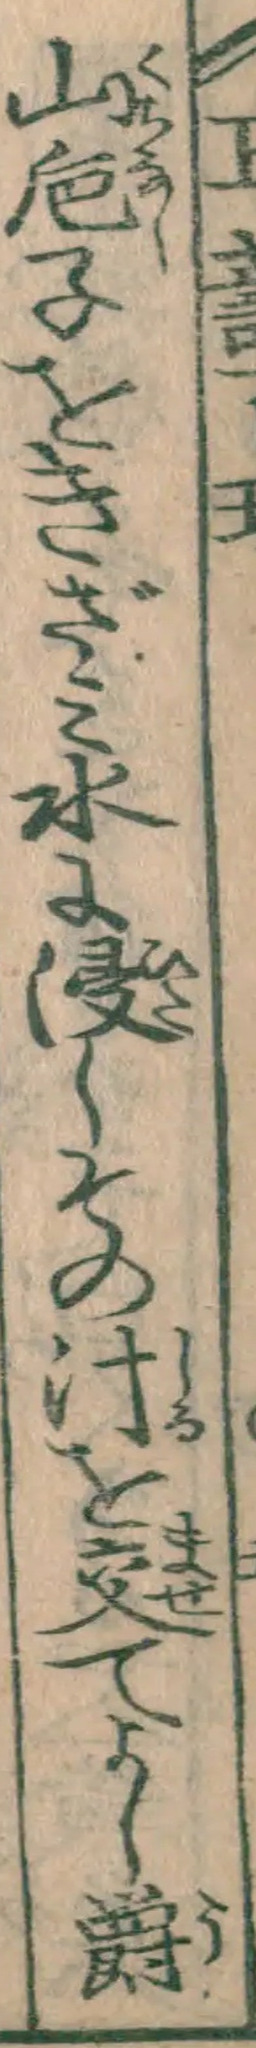山巵子をきざみ水に浸しその汁を交てよし爵
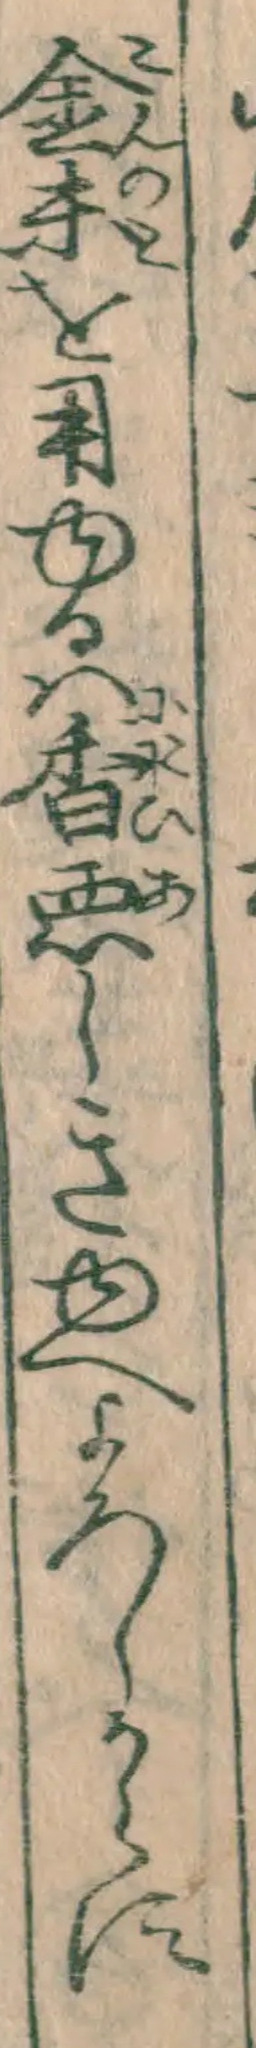金未を用ゆるは香悪しきゆへよろしからす
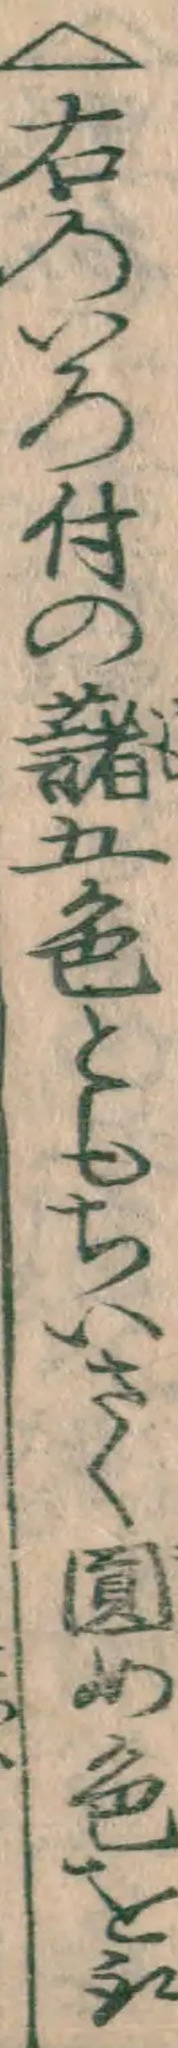△右のいろ付の藷五色ともちいさく円め色を取
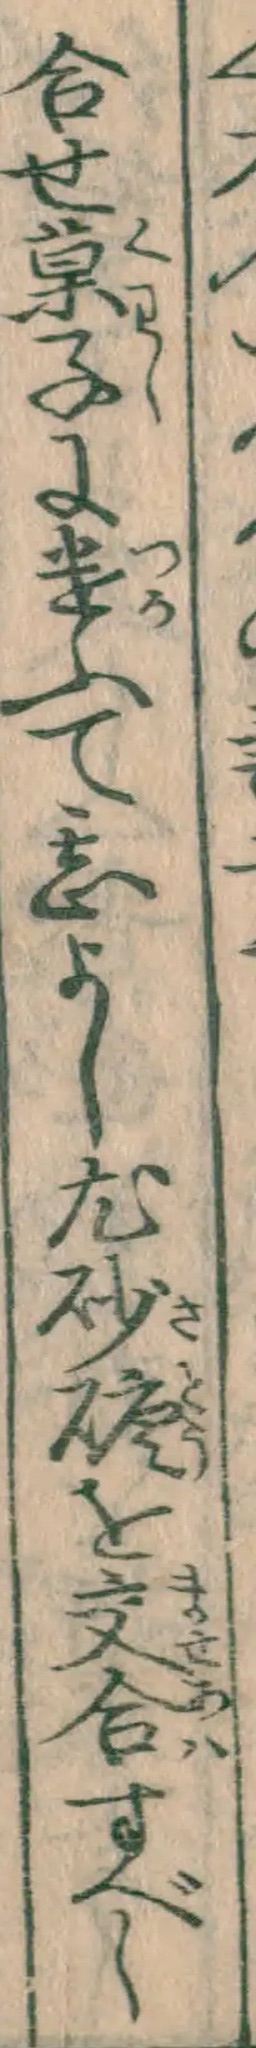合せ菓子に遣ふて甚よし尤砂糖を交合すべし
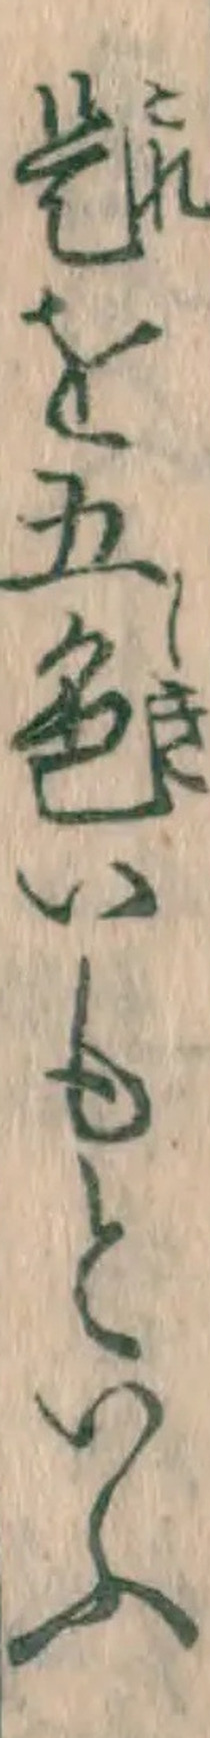是を五色いもといふ
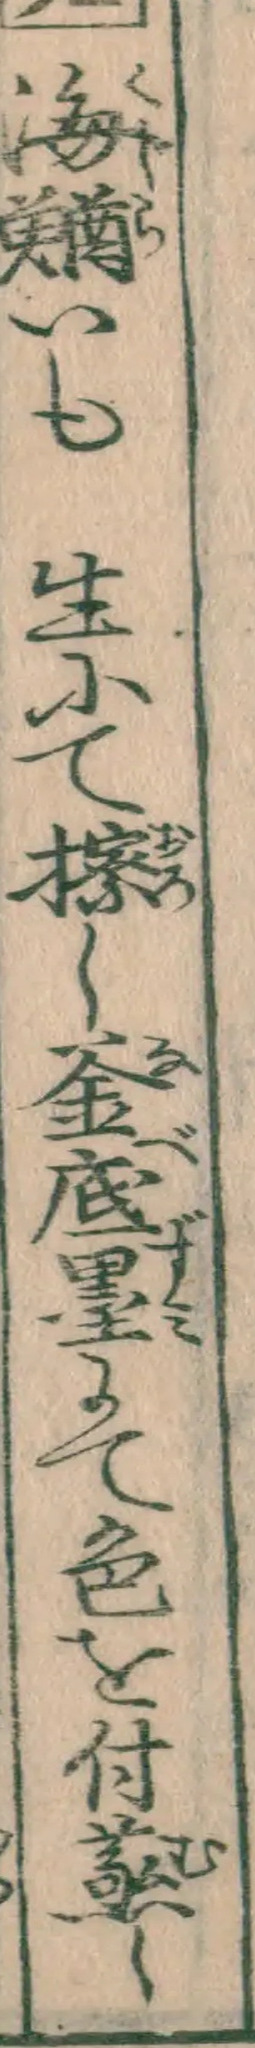[十九]海鰌いも生にて擦し釜底墨にて色を付蒸し
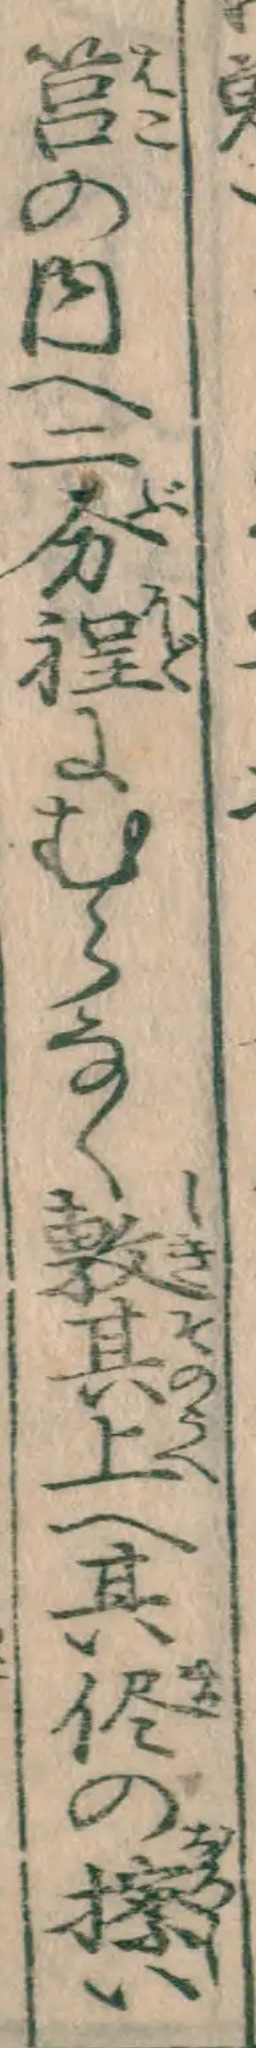筥の内へ二分程にむらなく敷其上へ其侭の擦い
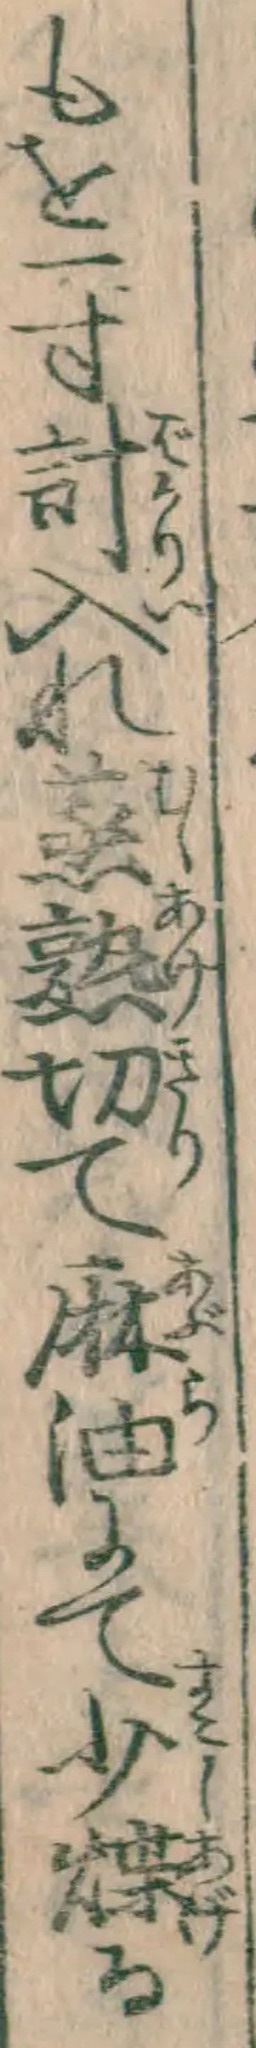もを一寸計入れ蒸熟切て麻油にて少煠る
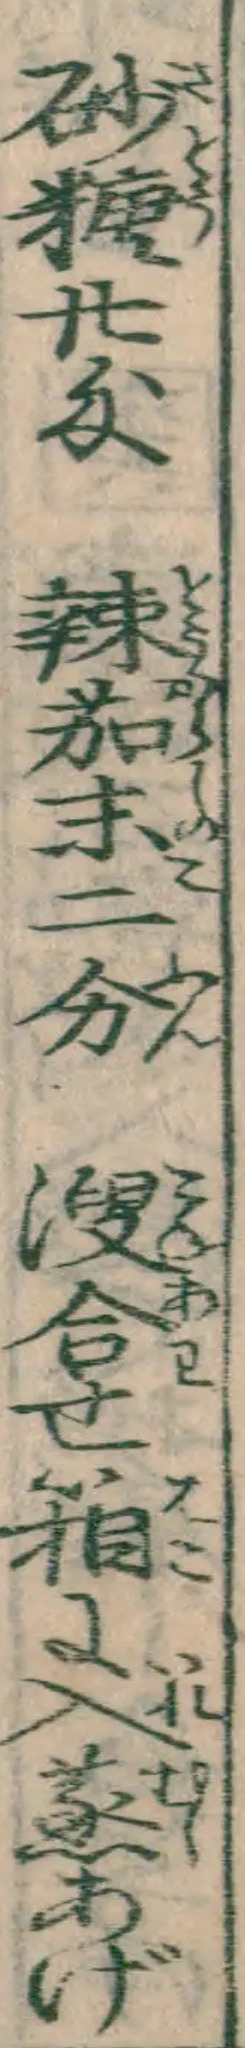砂糖廿匁辣茄末二分溲合せ箱に入蒸あげ
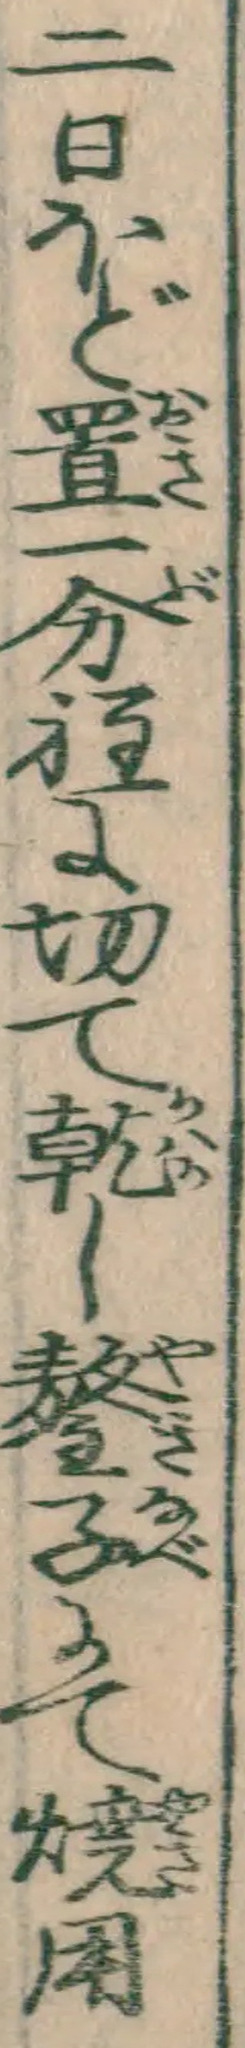二日ほど置一分程に切て乾し鏊子にて焼用
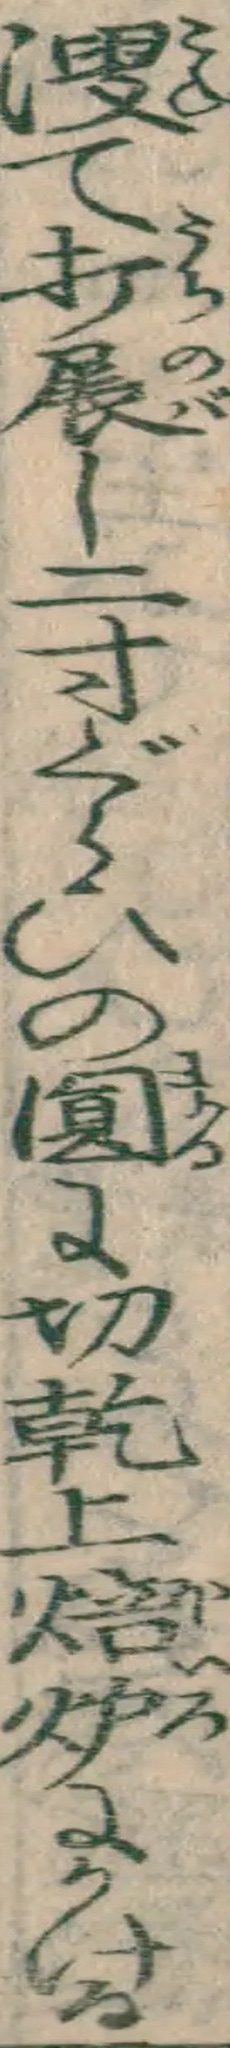溲て打展し二寸ぐらひの円に切乾上焙炉にかける
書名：甘藷百珍
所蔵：国立国会図書館 National Diet Library, JAPAN
